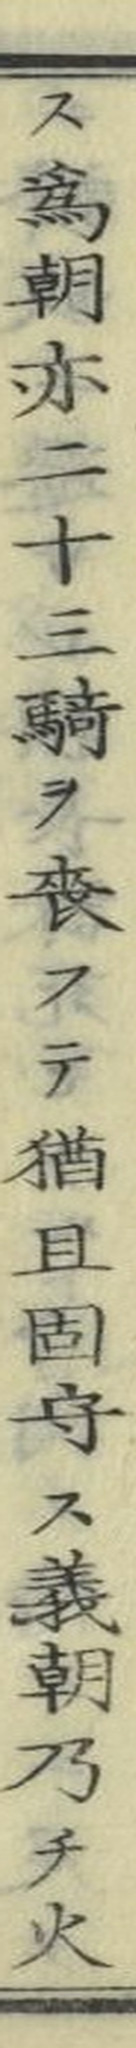ス爲朝亦二十三騎ヲフテ猶且固守ス義朝乃チ火
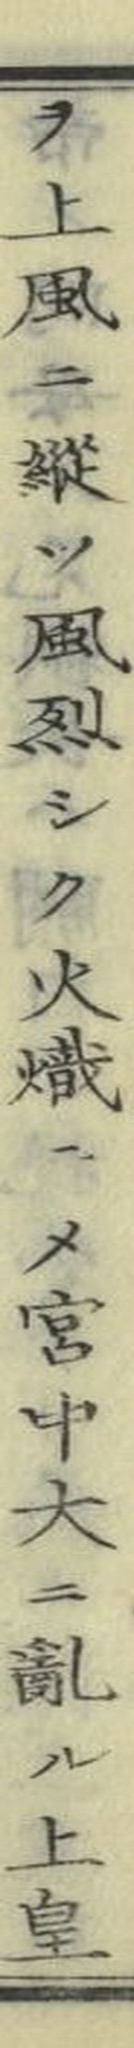ヲ上風ニ縦ツ風烈シク火熾ニシテ宮中大ニ亂ル上皇
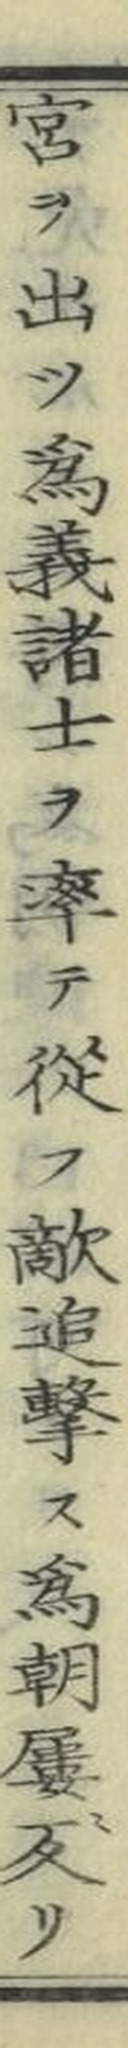宮ヲ出ツ爲義諸士ヲ率テ從フ歒追擊ス爲朝屢〻反リ
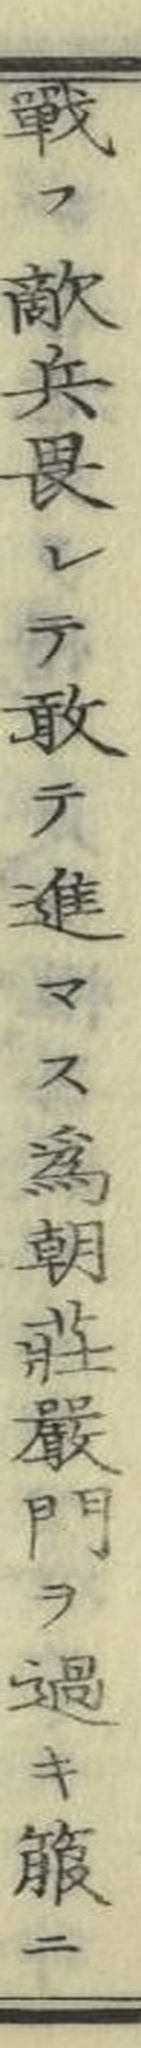戰フ歒兵畏レテ敢テ進マス爲朝莊嚴門ヲ過キ箙ニ
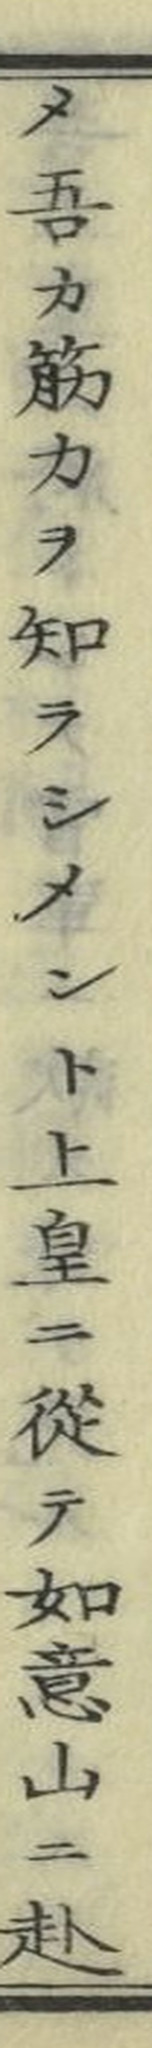シテ吾カ筋力ヲ知ラシメント上皇ニ從テ如意山ニ赴
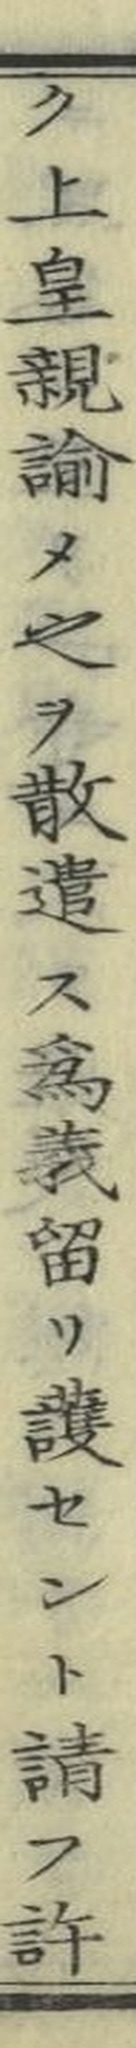ク上皇親諭シテ之ヲ散遣ス爲義留リ護セント請フ許
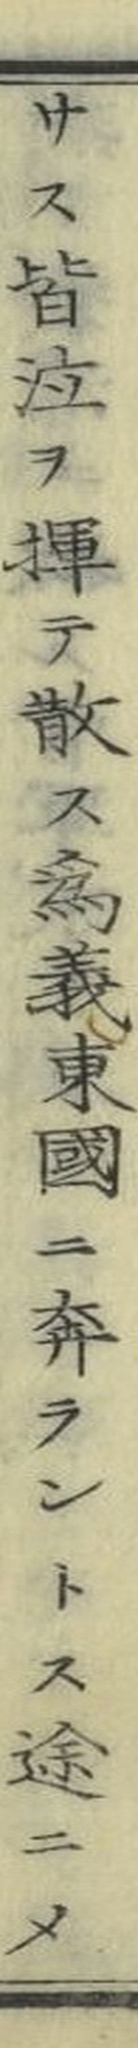サス皆泣ヲ揮テ散ス爲義東國ニ奔ラントス途ニシテ

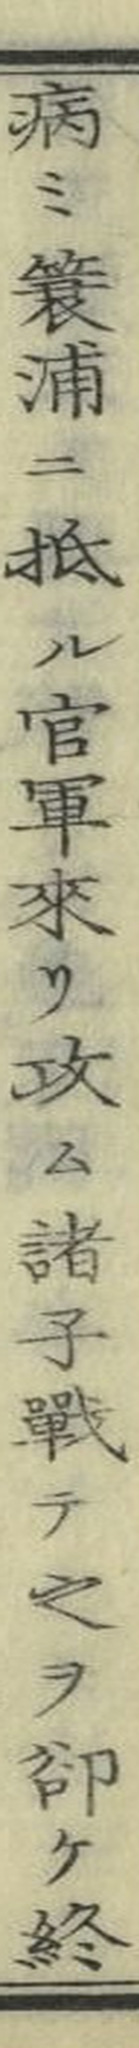病ミ簑浦ニ抵ル官軍來リ攻ム諸子戰テ之ヲ卻ケ終
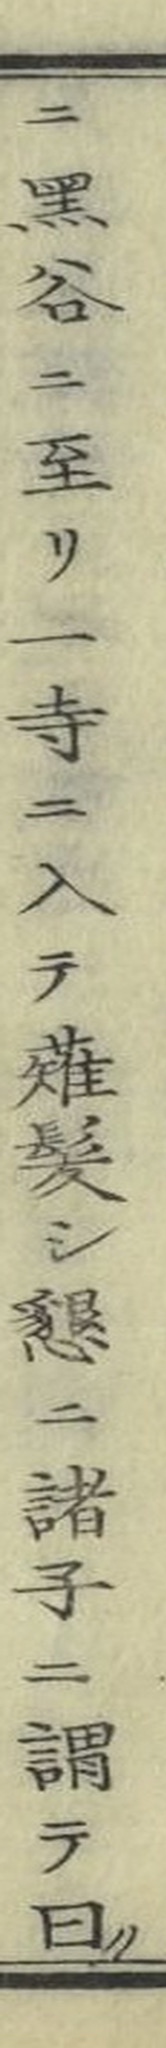ニ黑谷ニ至リ一寺ニ入テ薙髮シ懇ニ諸子ニ謂テ曰
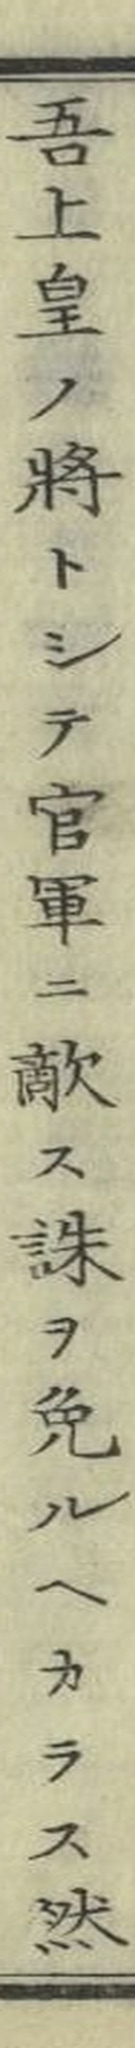吾上皇ノ將トシテ官軍ニ歒ス誅ヲ免ルヘカラス然
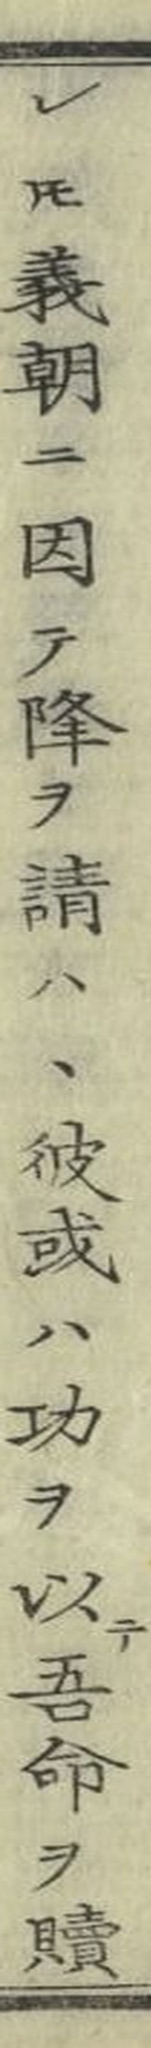レトモ義朝ニ因テ降ヲ請ハヽ彼或ハ功ヲ以吾命ヲ贖
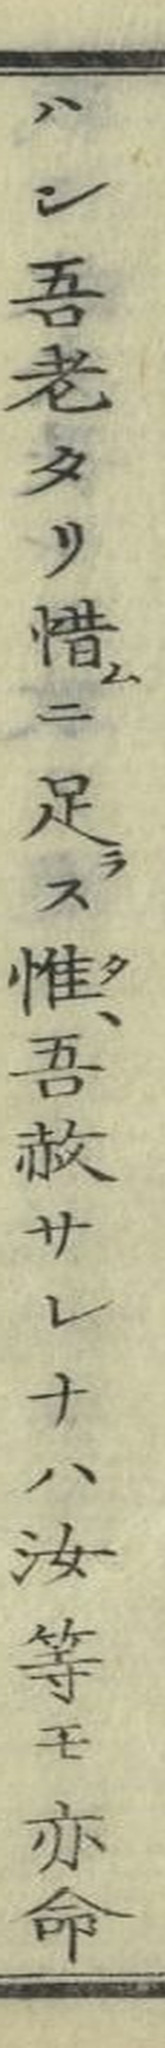ハン吾老タリ惜ニ足ス惟吾赦サレナハ汝等モ亦命
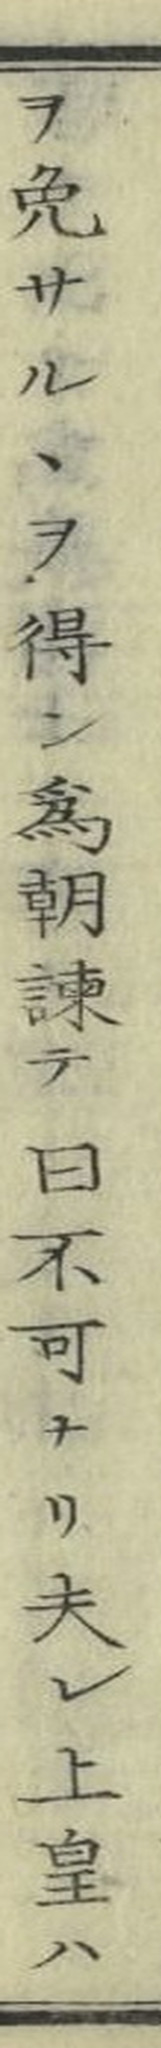ヲ免サルヽヲ得ン爲朝諫テ曰不可ナリ夫レ上皇ハ
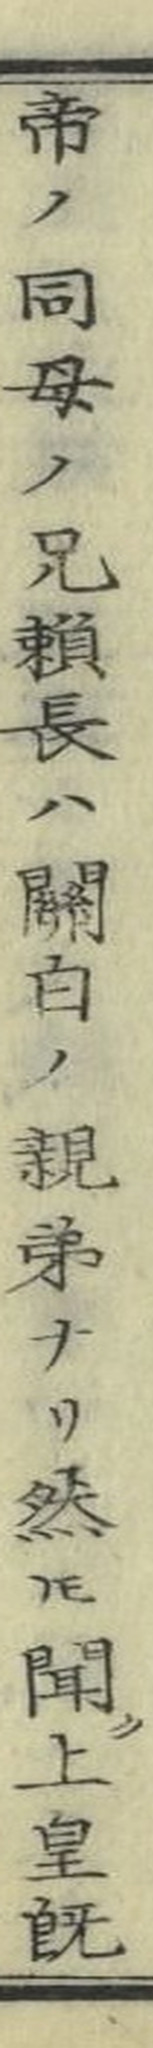帝ノ同母ノ兄頼長ハ關白ノ親弟ナリ然トモ聞上皇既
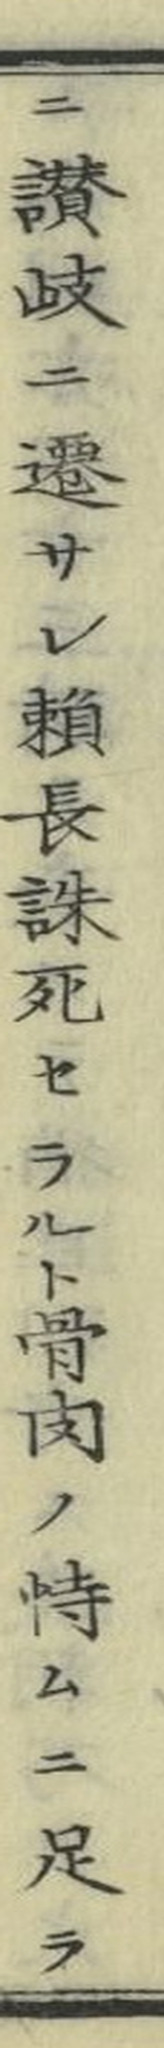ニ讚岐ニ遷サレ賴長誅死セラルト骨肉ノ恃ムニ足ラ
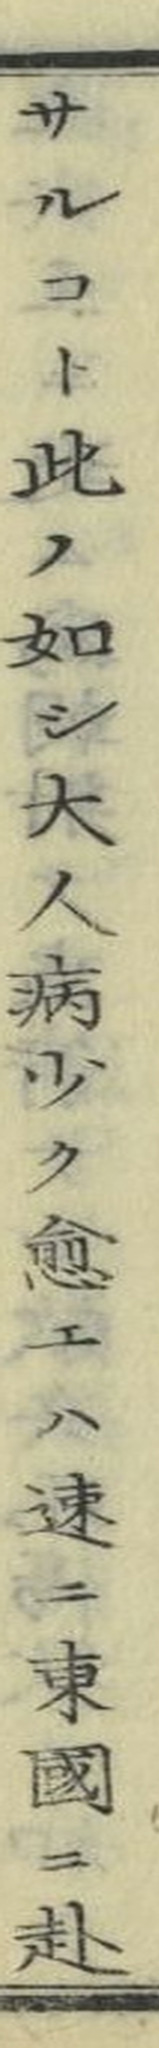サルコト此ノ如シ大人病少ク愈エハ速ニ東國ニ赴
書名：琉球藩史 一之巻
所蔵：University of the Ryukyus Library
